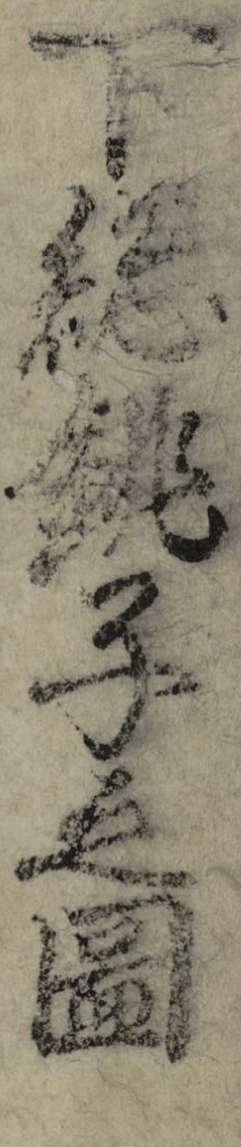下総銚子之図
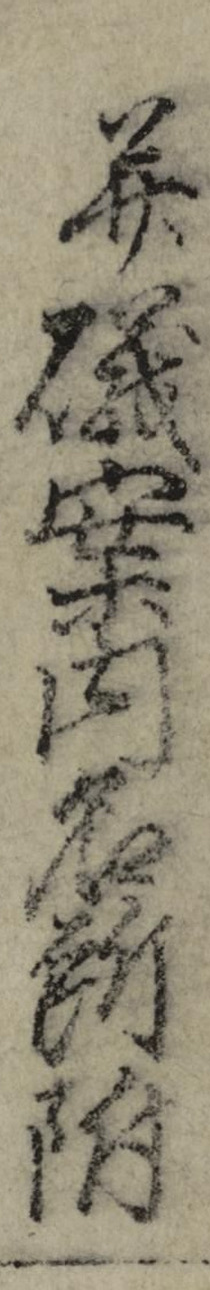并磯案内名所附
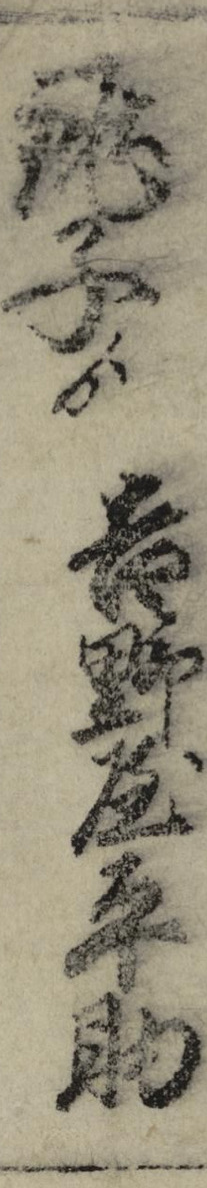銚子ゟ吉野屋平助
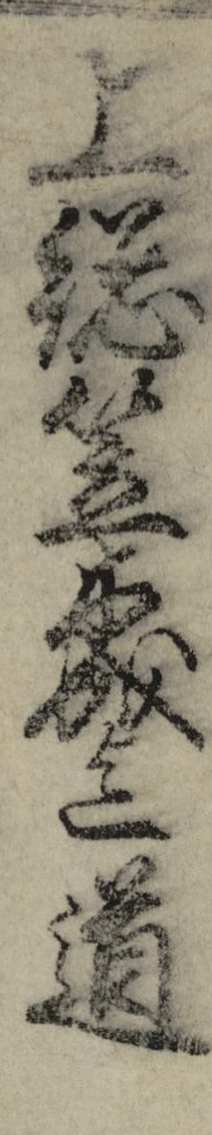上総笠森迄道
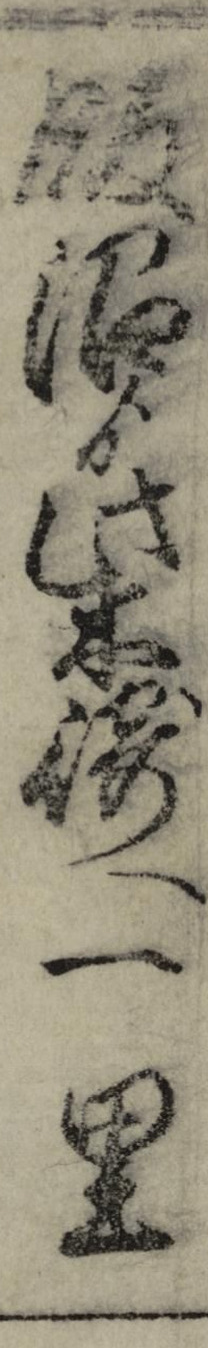飯沼ゟ柴崎へ一里
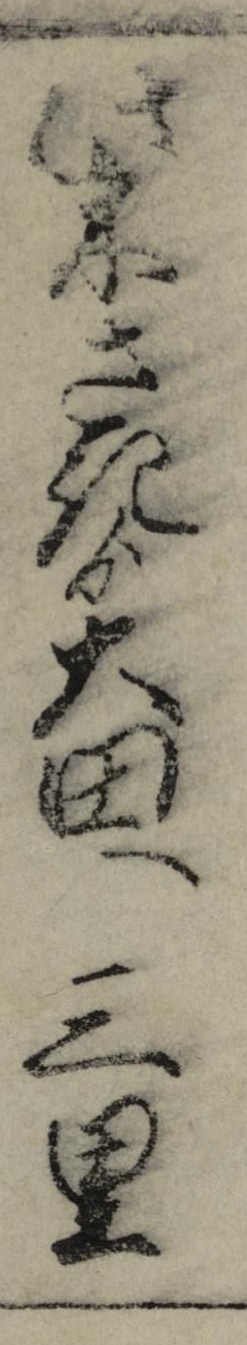柴さきゟ大田へ三里
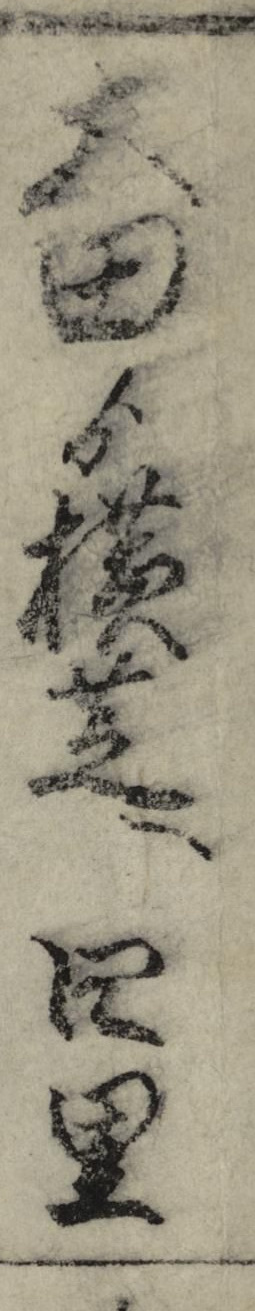大田ゟ横芝へ四里
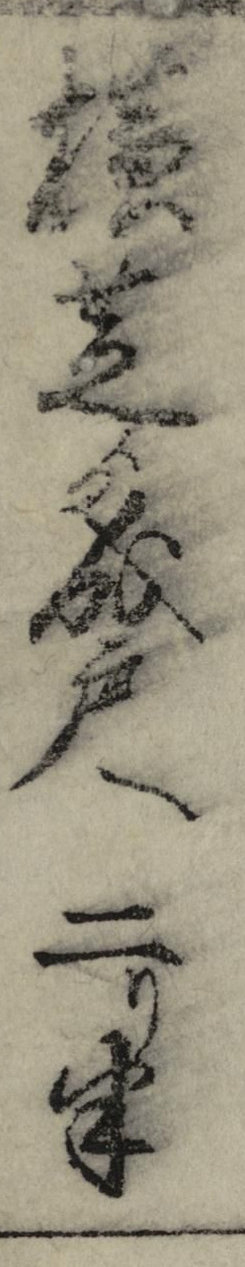横芝ゟ成戸へ二リ半
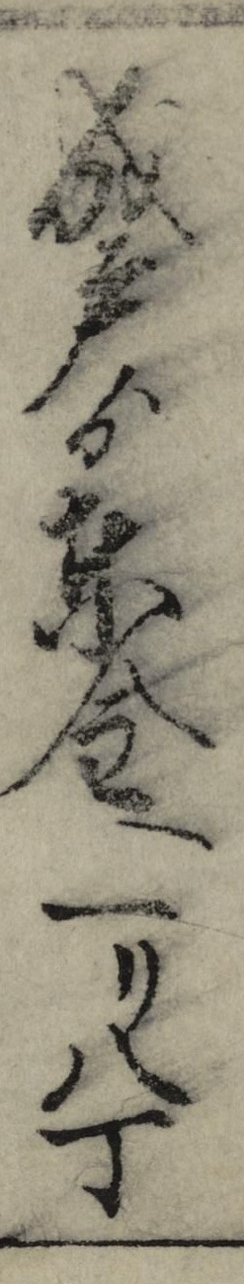成戸ゟ東金へ一リ八丁
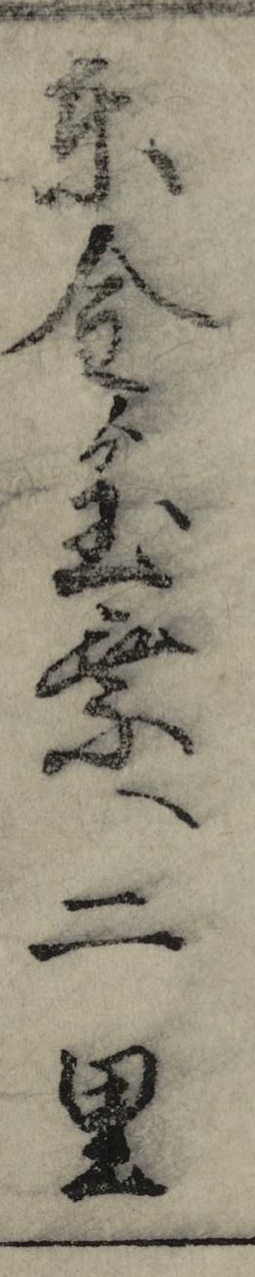東金ゟ玉乗へ二里
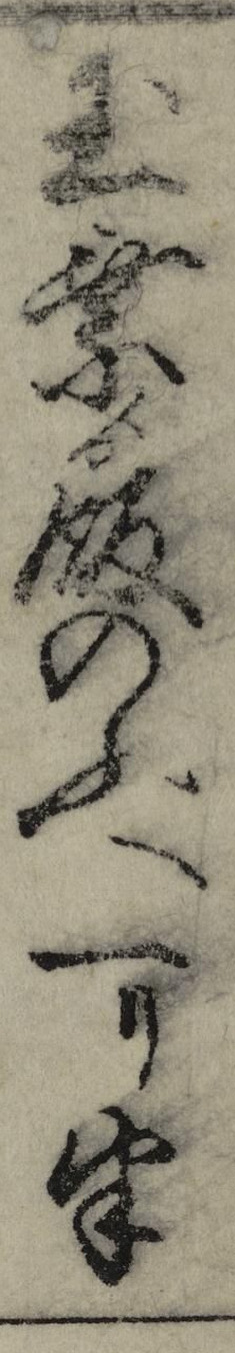玉乗ゟ飯のふへ一リ半
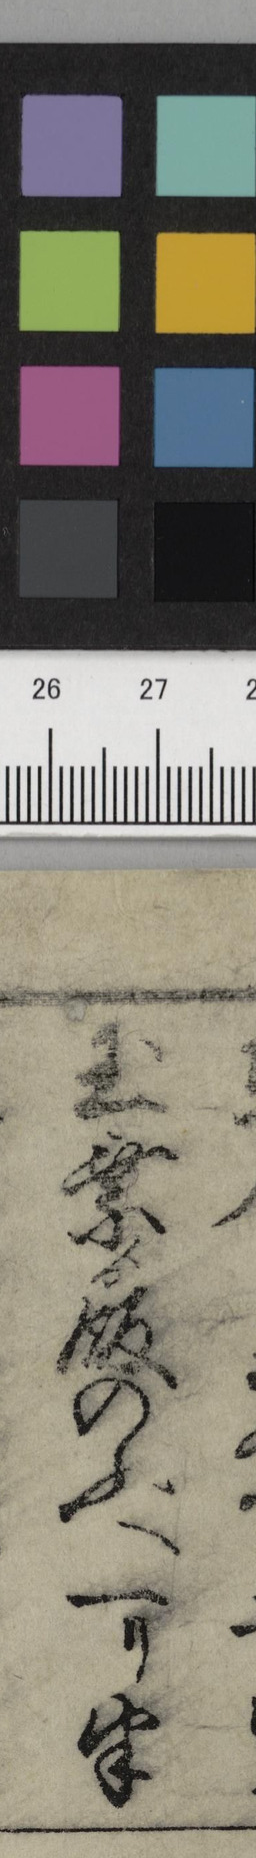玉乗ゟ飯のふへ一リ半
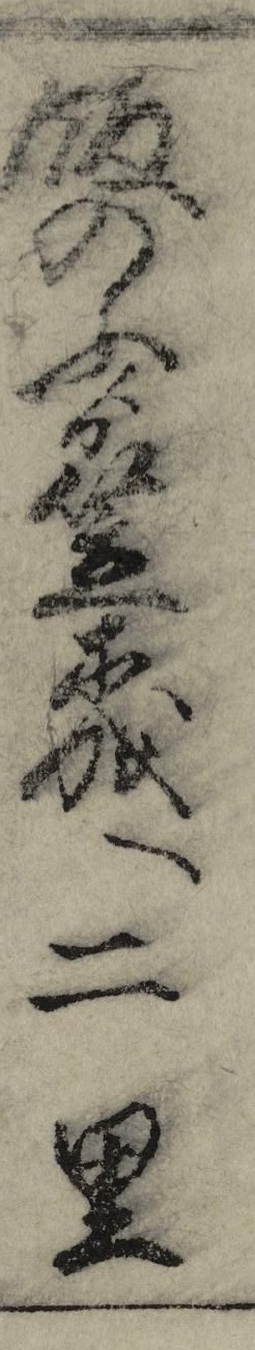飯のふゟ笠森ヘ二里
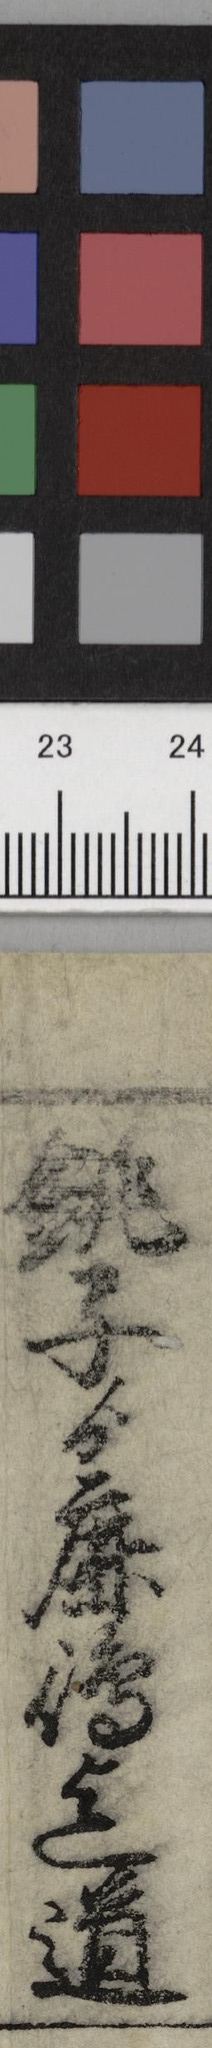銚子ゟ鹿島迄道
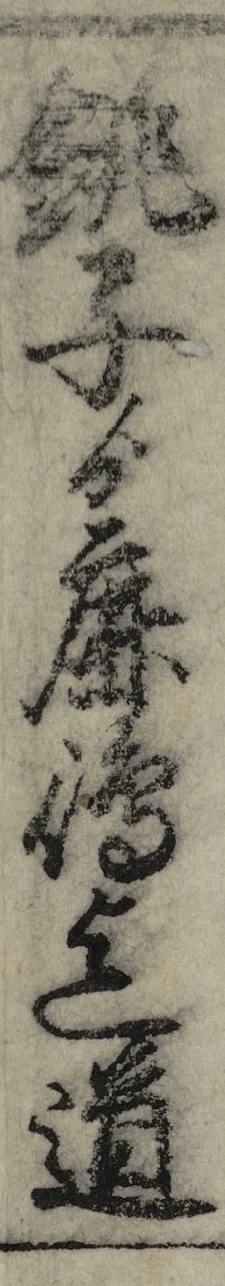銚子ゟ鹿島迄道
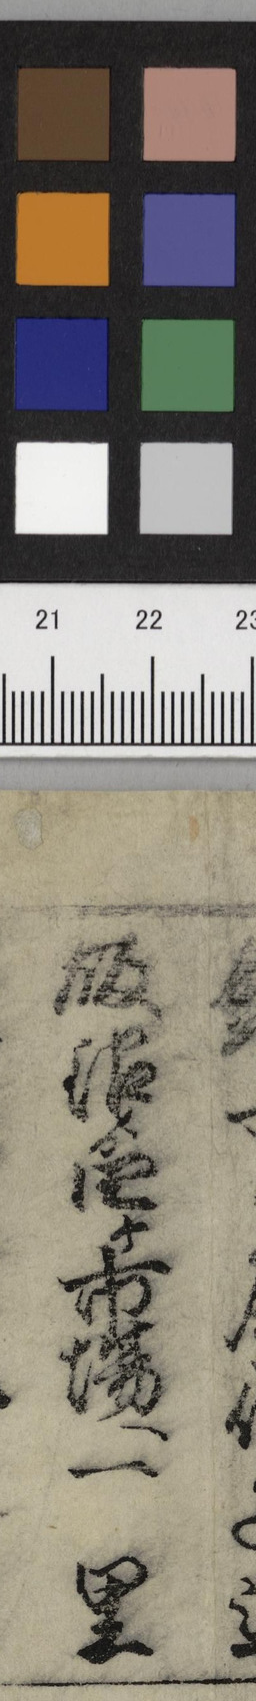飯沼ゟ四ヶ市場へ一里
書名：下総銚子之圖并磯案内名所附
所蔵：東京大学地震研究所図書室 Earthquake Research Institute Library, The University of Tokyo, JAPAN
